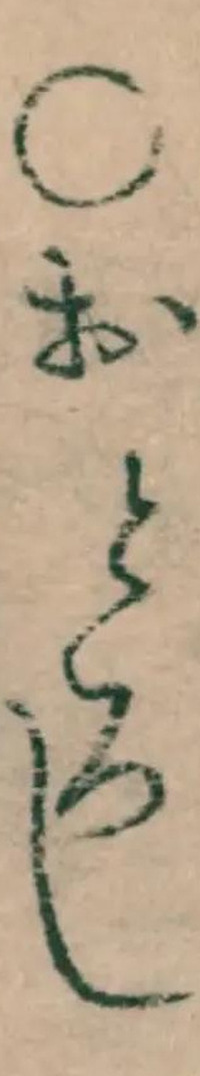○おとろし
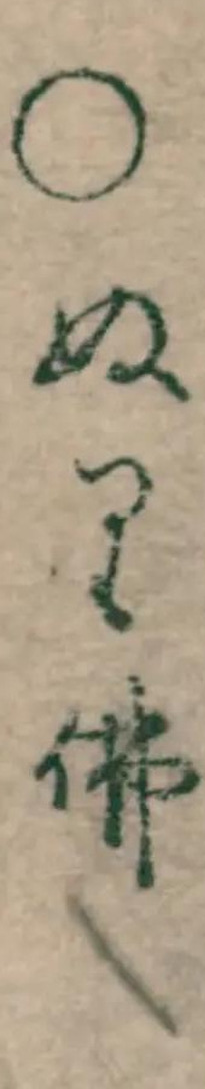○ぬり仏
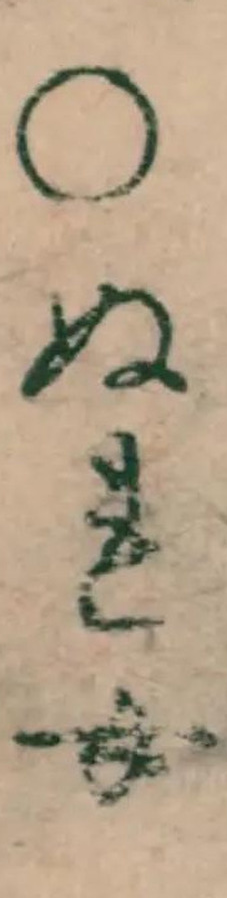○ぬれ女
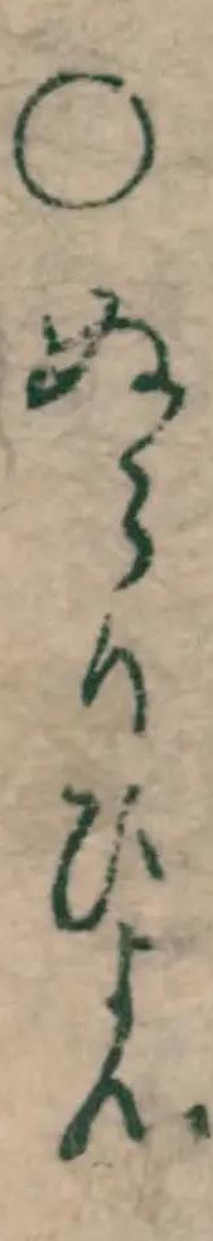○ぬらりひよん
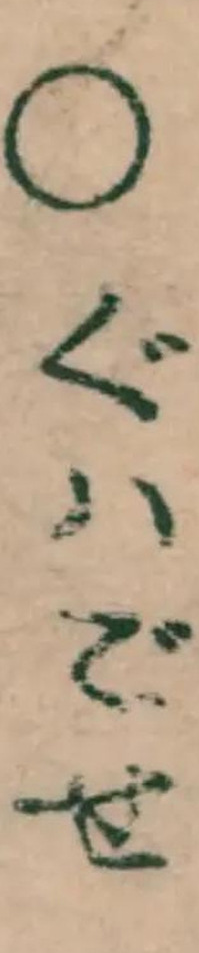○ぐはごせ
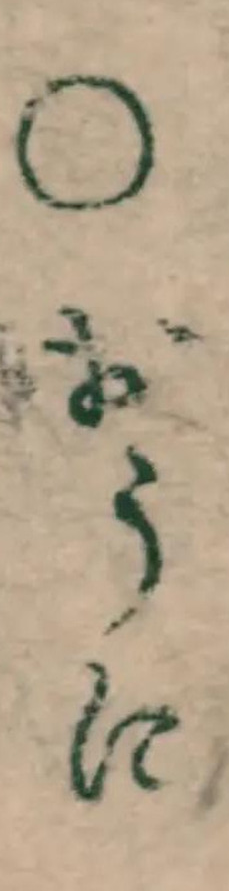○おうに
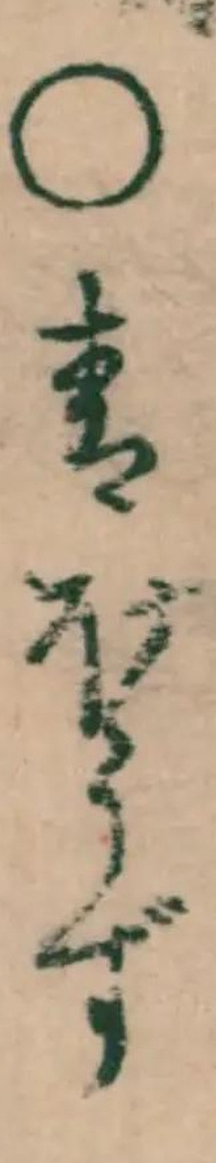○青ぼうず
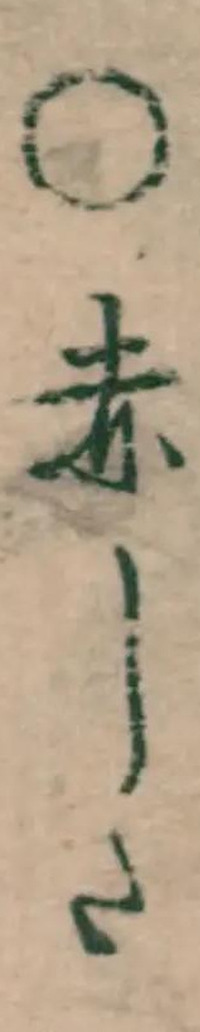○赤した
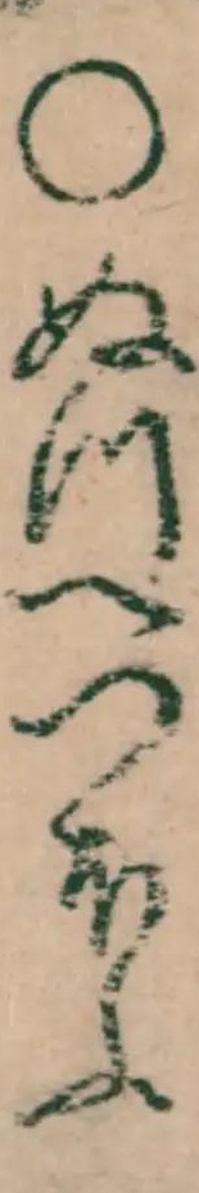○ぬつへつほふ
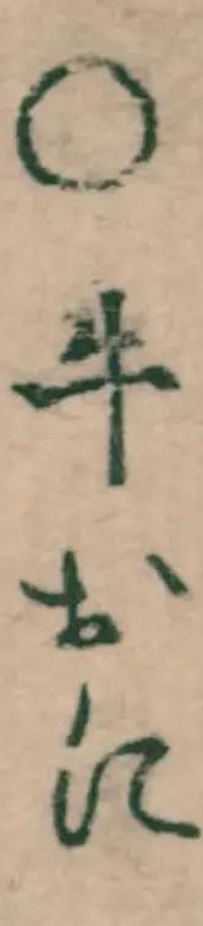○牛おに
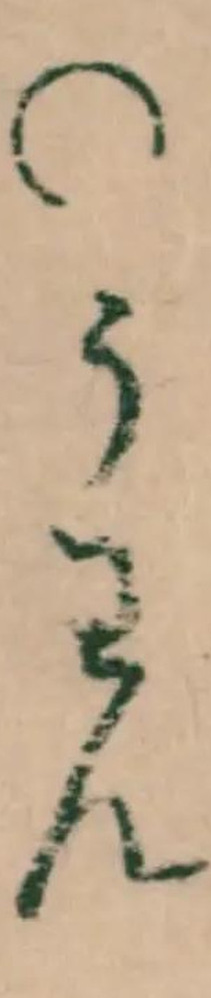○うわん
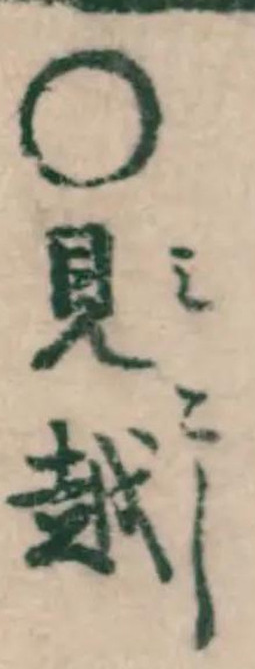○見越

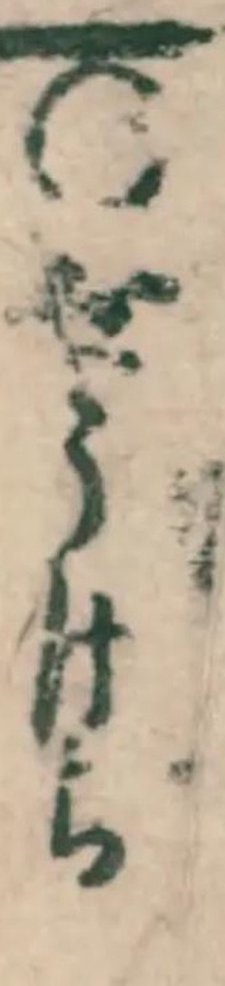○せうけら
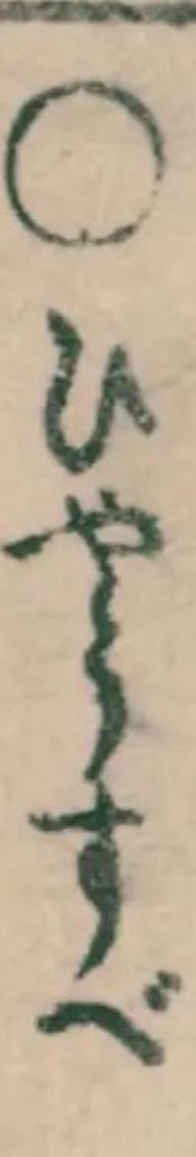○ひやうすべ

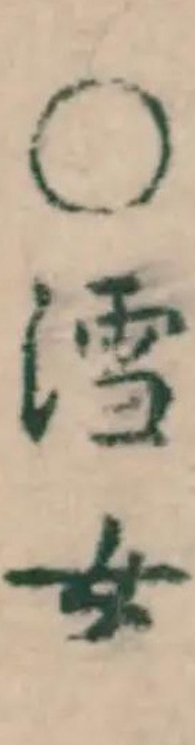○濡女

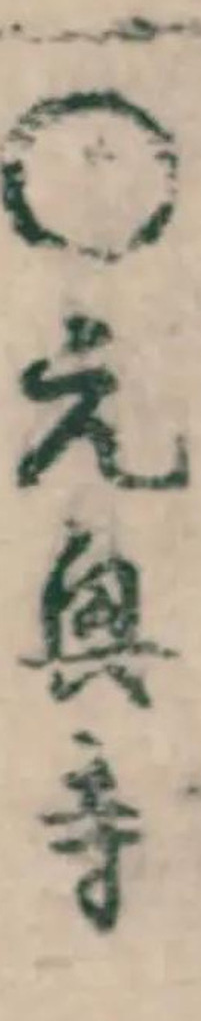○元興寺
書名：百鬼夜行 3巻拾遺3巻. [1]
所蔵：国立国会図書館 National Diet Library, JAPAN
